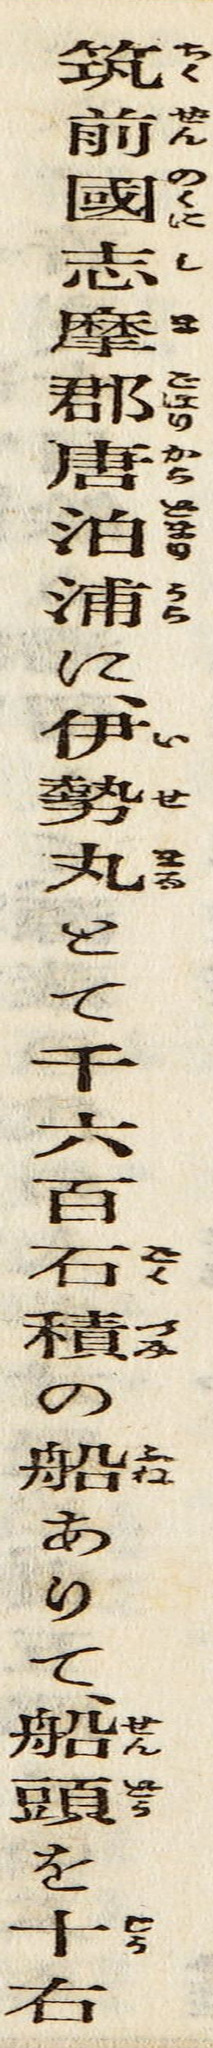筑前国志摩郡唐泊浦に、伊勢丸とて千六百石積の船ありて、船頭を十右
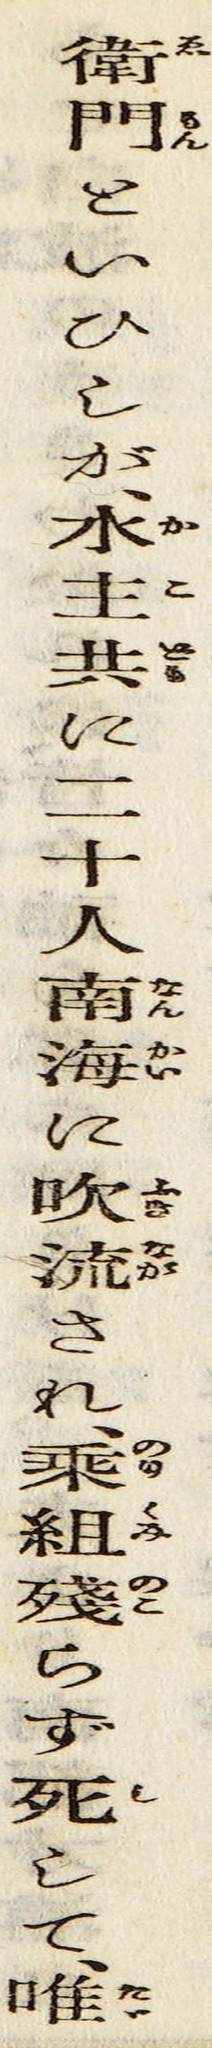衛門といひしが、水主共に二十人南海に吹流され、乗組残らず死して、唯
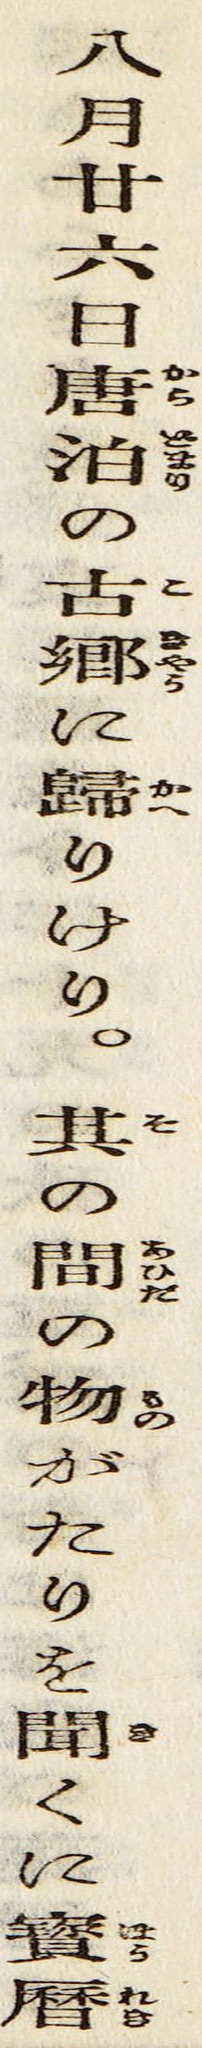八月廿六日唐泊の古郷に帰りけり。其の間の物がたりを聞くに宝暦
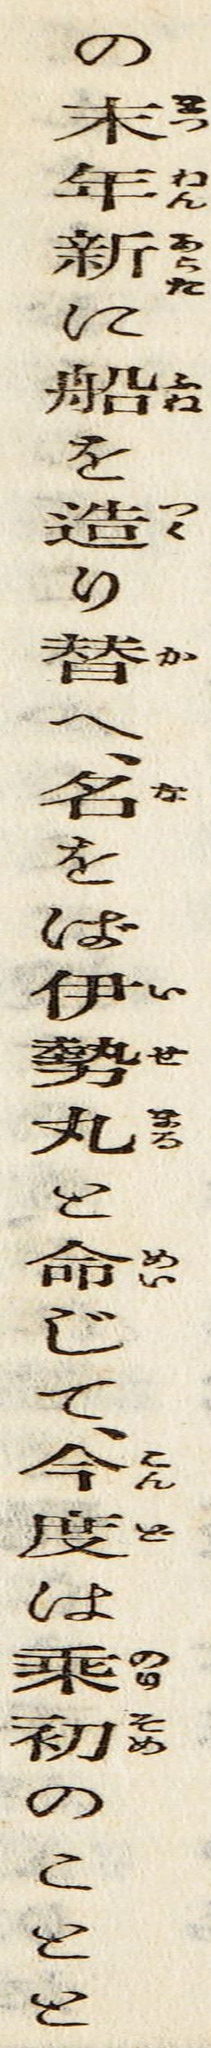の末年新に船を造り替へ、名をば伊勢丸と命じて、今度は乗初のことと
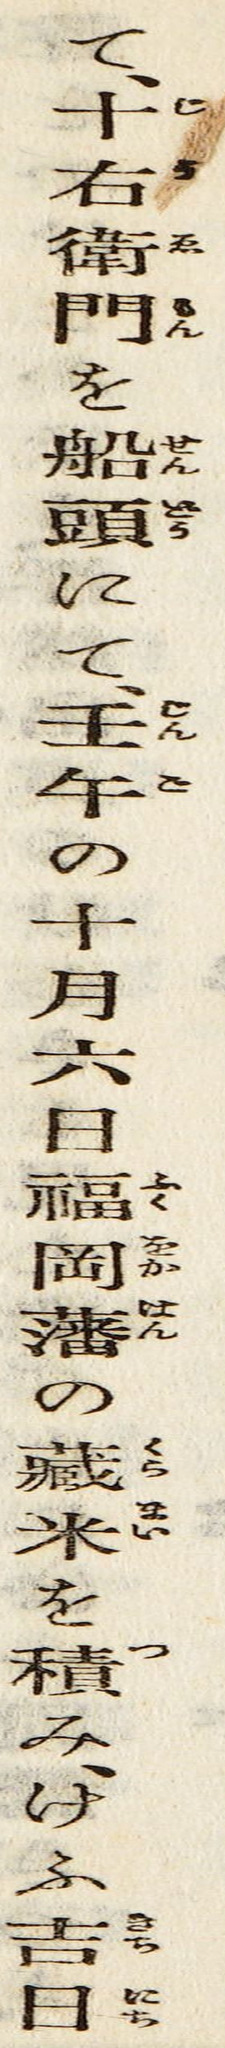て、十右衛門を船頭にて、壬午の十月六日福岡藩の蔵米を積み、けふ吉日
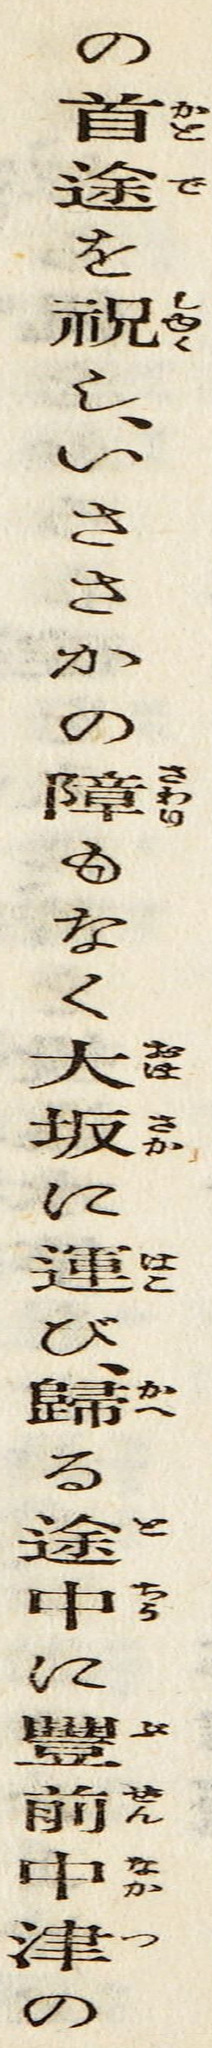の首途を祝し、いささかの障もなく大坂に運び、帰る途中に豊前中津の
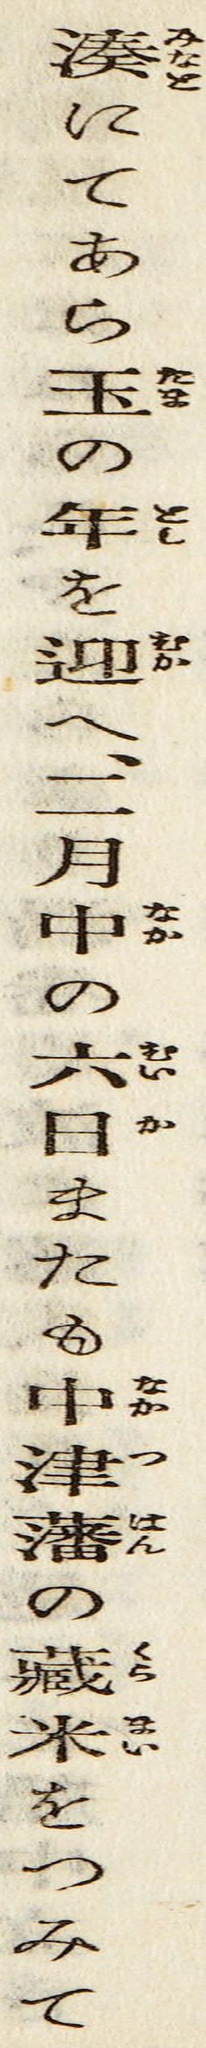湊にてあら玉の年を迎へ、二月中の六日またも中津藩の蔵米をつみて
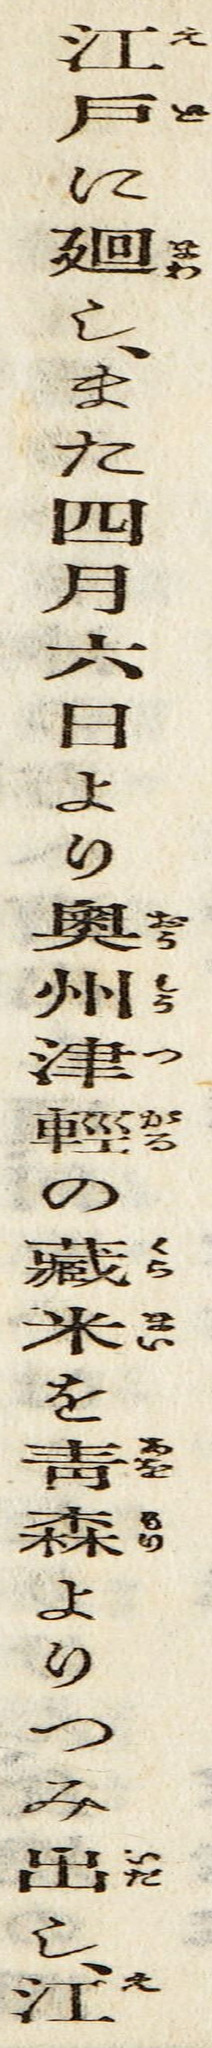江戸に廻し、また四月六日より奥州津軽の蔵米を青森よりつみ出し、江
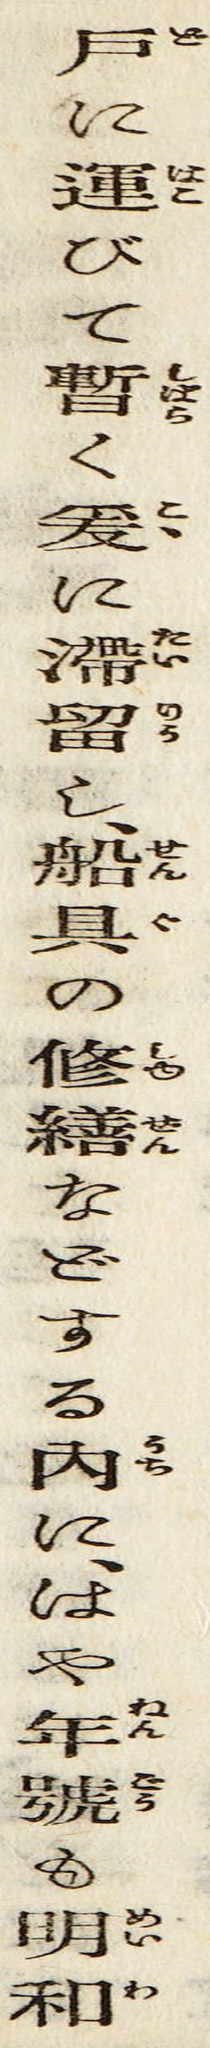戸に運びて暫く爰に滞留し、船具の修繕などする内に、はや年号も明和
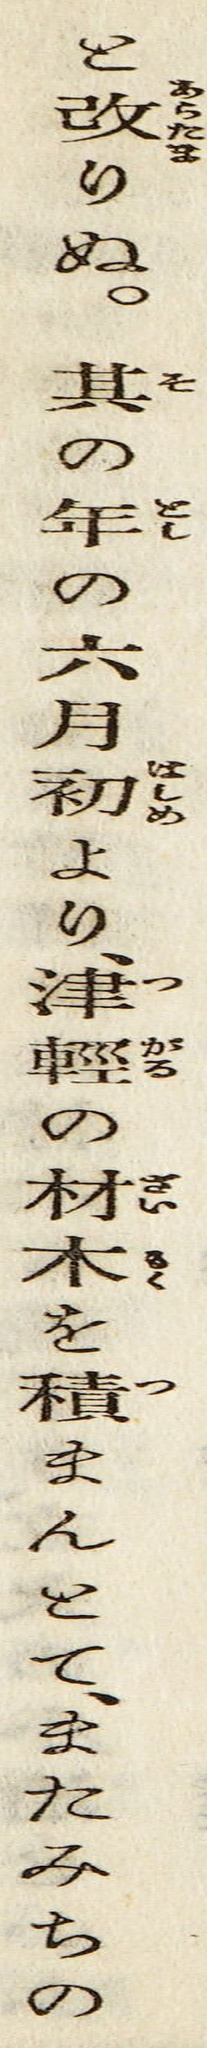と改りぬ。其の年の六月初より、津軽の材木を積まんとて、またみちの

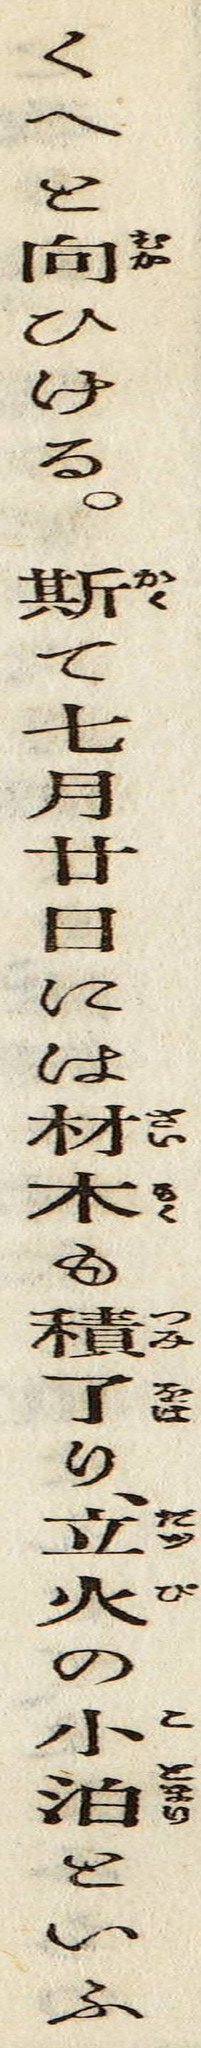くへと向ひける。斯て七月廿日には材木も積了り、立火の小泊といふ
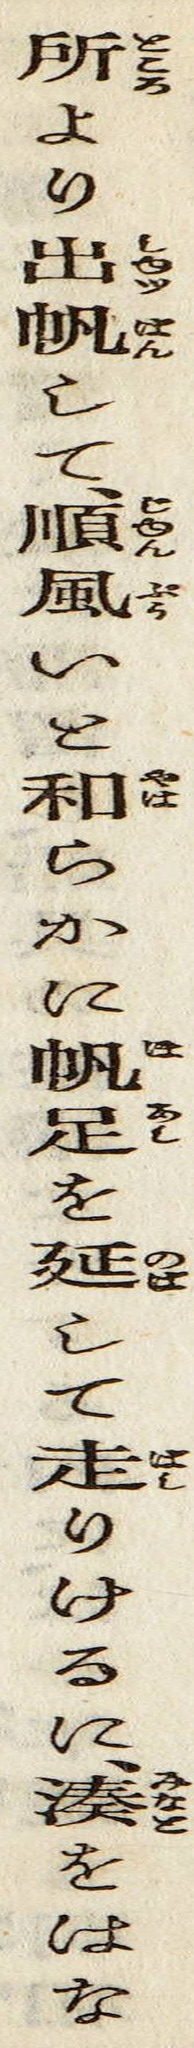所より出帆して、順風いと和らかに帆足を延して走りけるに、湊をはな
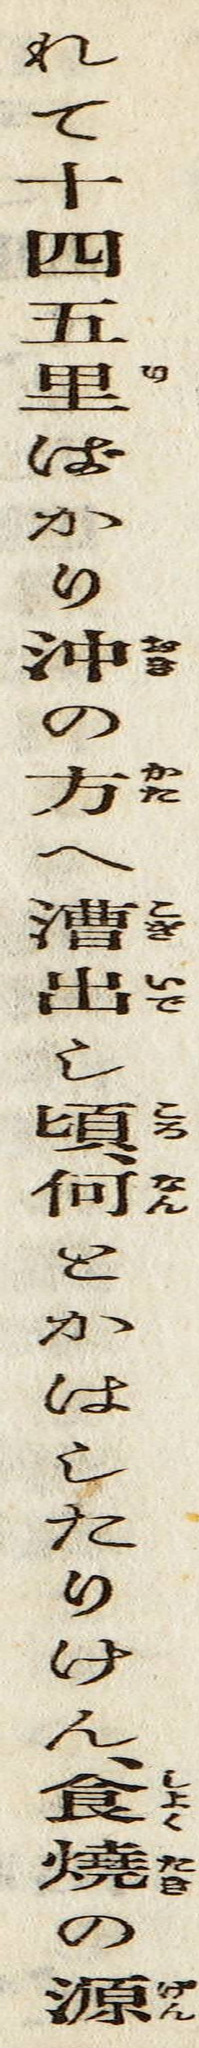れて十四五里ぱかり沖の方へ漕出し頃、何とかはしたりけん、食焼の源
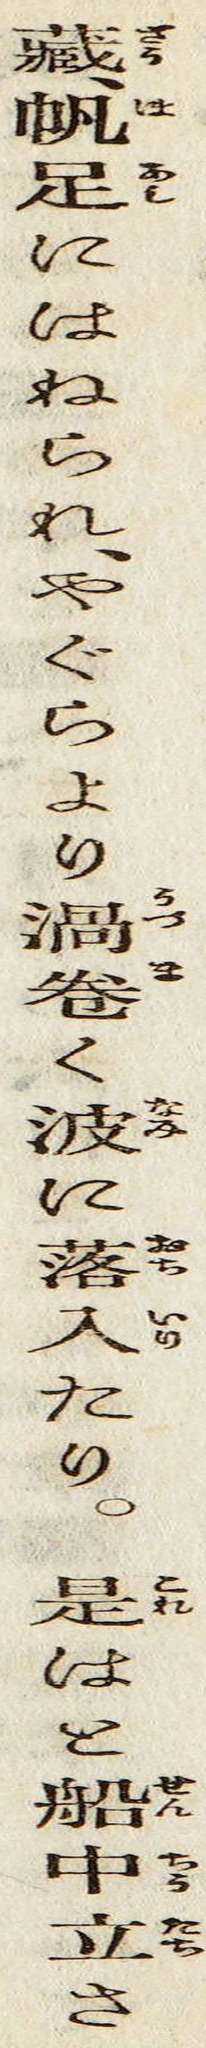蔵、帆足にはねられ、やぐらより渦巻く波に落入たり。是はと船中立さ
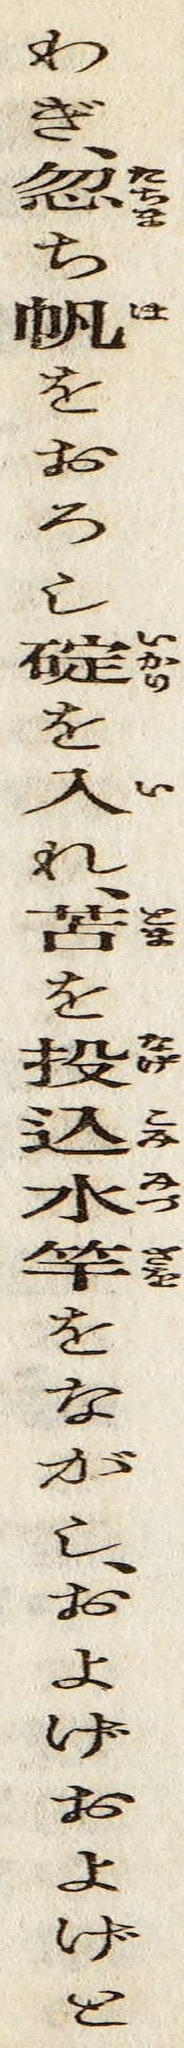わぎ、忽ち帆をおろし碇を入れ、苫を投込水竿をながし、およげおよげと
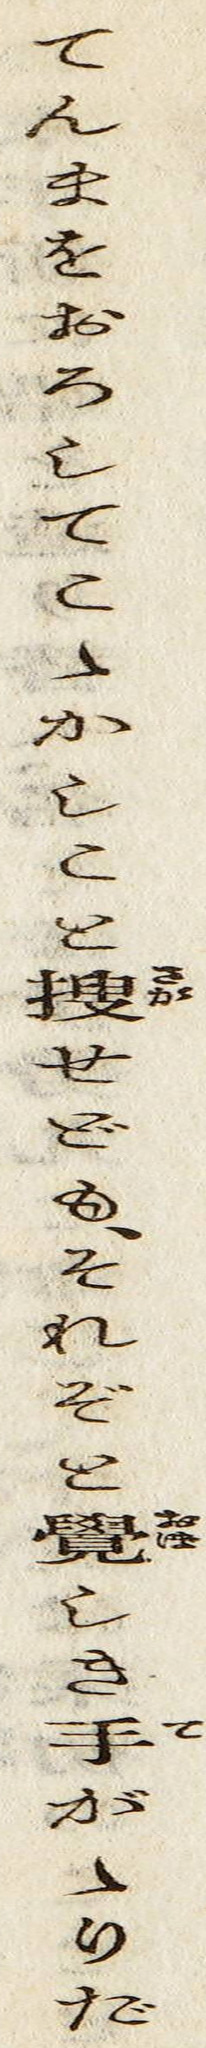てんまをおろしてこゝかしこと捜せども、それぞと覚しき手がゝりだ
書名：日本漂流譚
